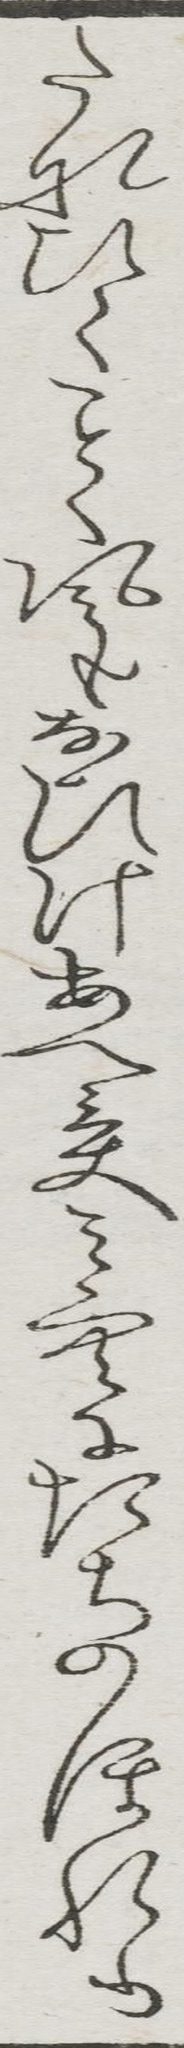たなひくことく風もなひけあへすみ空にたちのほれり
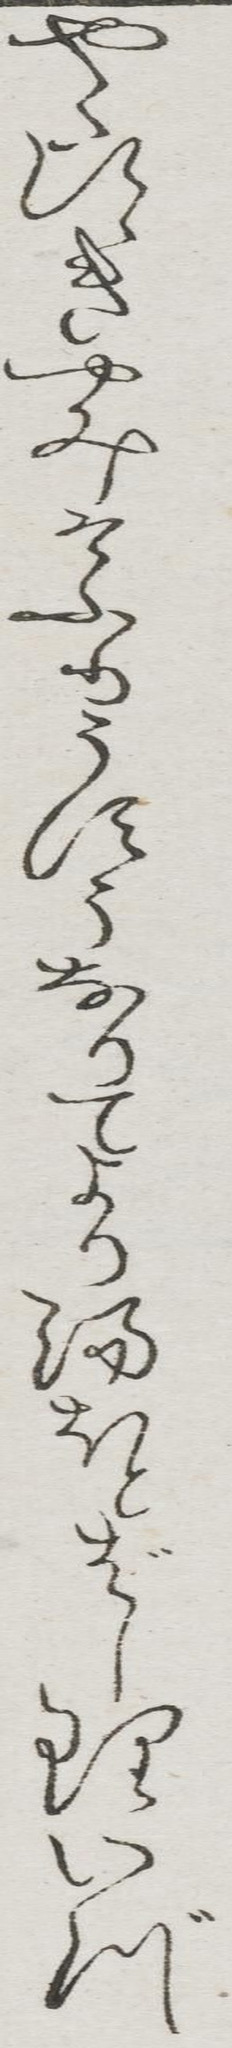やゝひゝきやみけふりうすうなりてより湯ほとばしりいづ
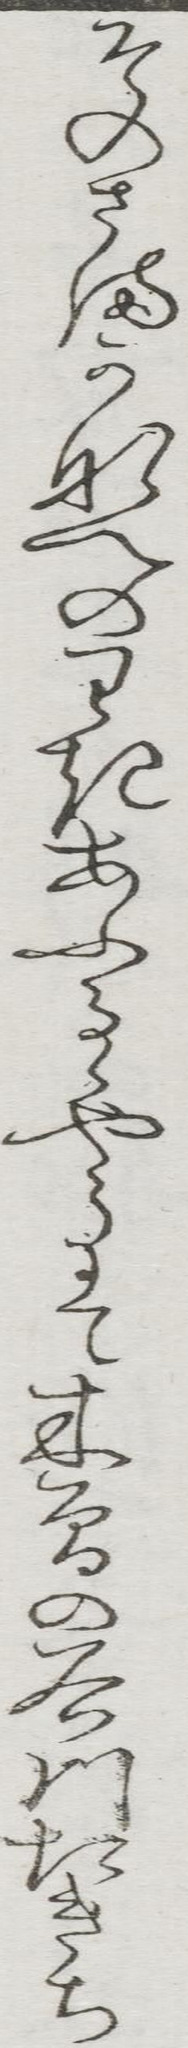そのさまかなへのわきあふるゝやうにて木曽の谷川たきち
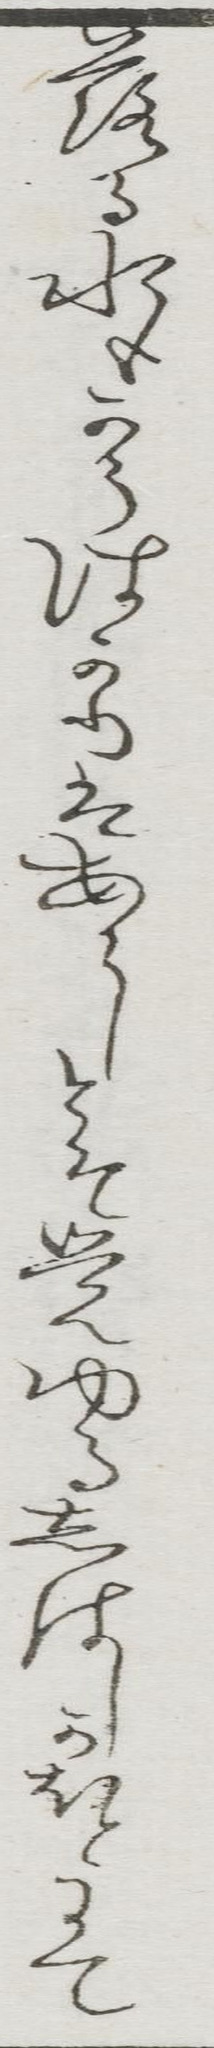落る水もかうはかりはあらしとそ覚ゆるしはしかほとにて
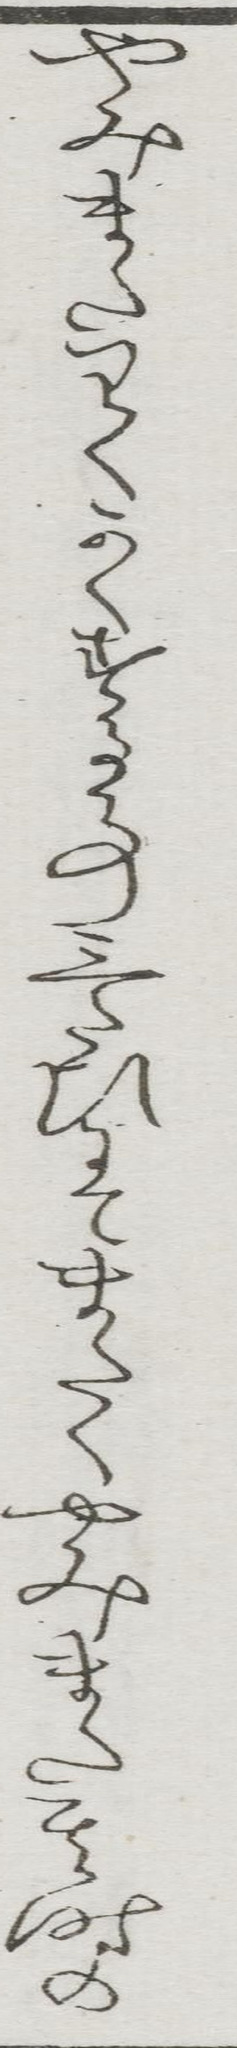やみまたわくかくする事三たひにてまた〳〵やみまた其時の
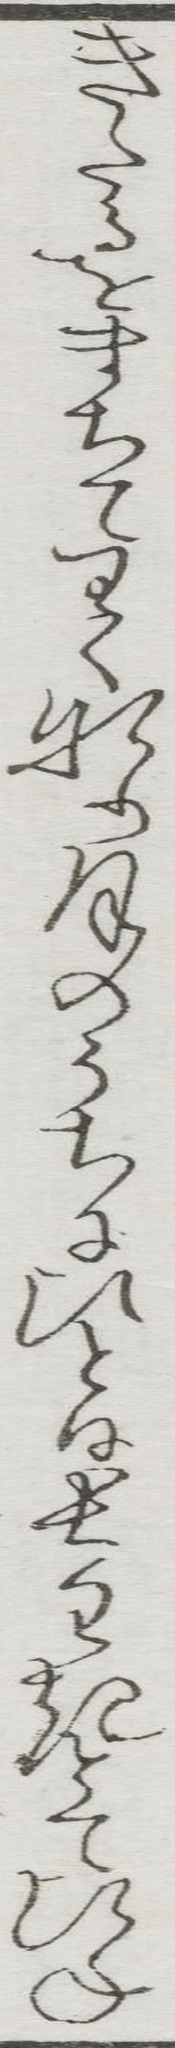きたるをまちてわくなり月のうちにひと日長わきとてひね
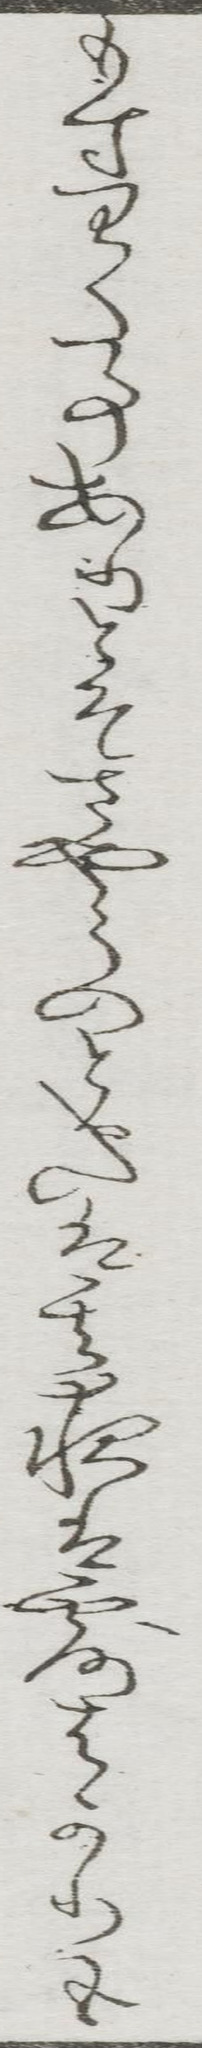もすわく事ありとそさやうのときは其夜は露はかりも
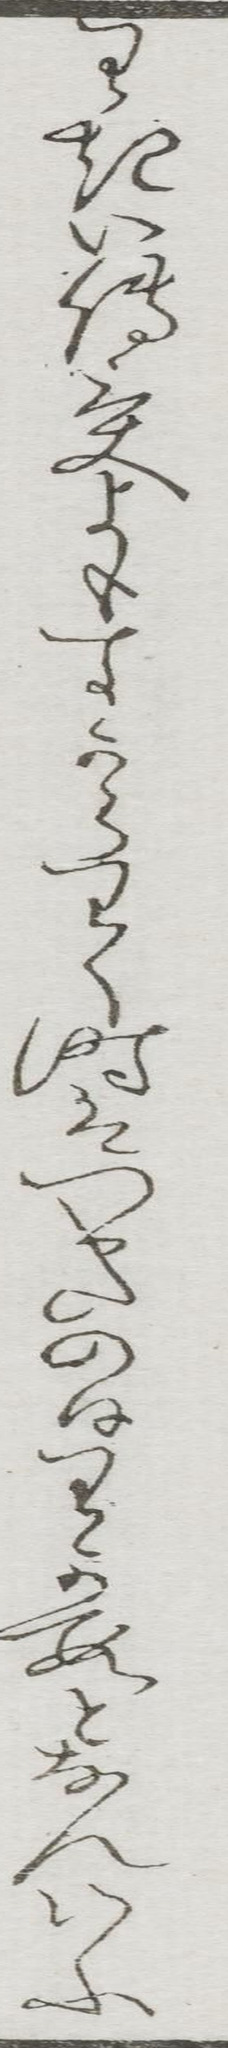わきいてすよもすからわく時はつきの日わかすとなんいふ
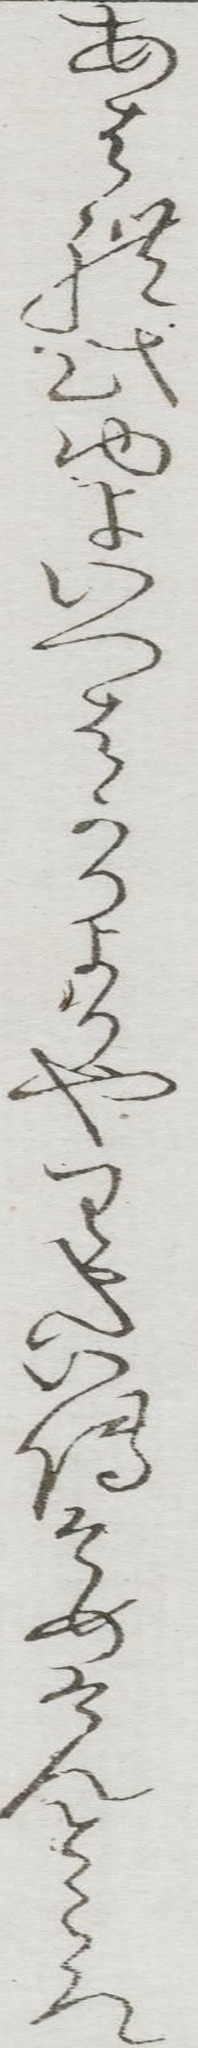あはれ此ゆよいつはかりよりやわきいてそめけんところ
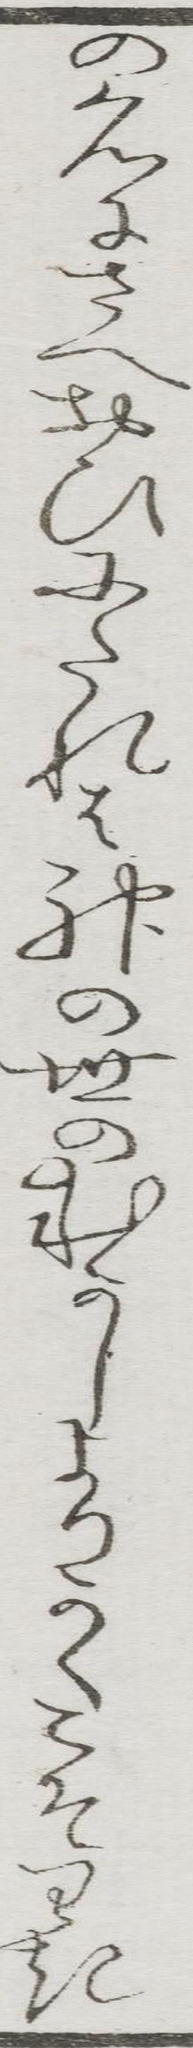の名にさへおひにたれは神の世のむかしよりかくこそわき
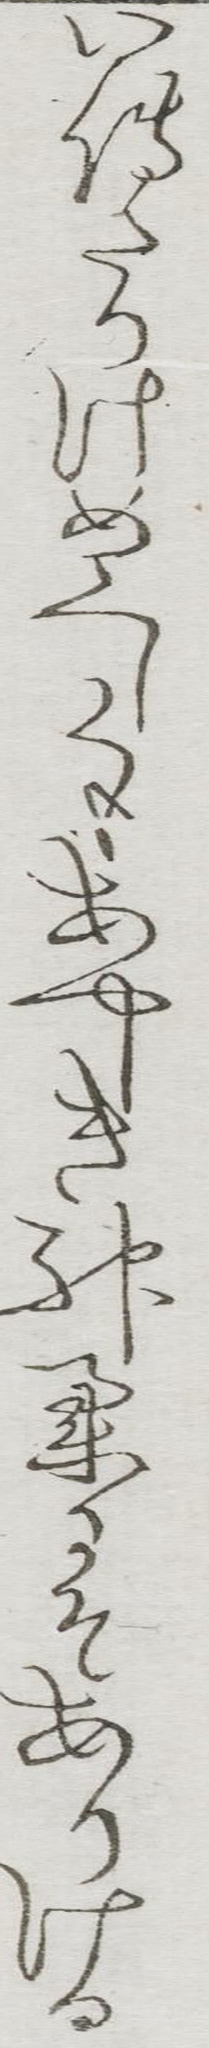いてたりけめくしくもあやしき神にそありける
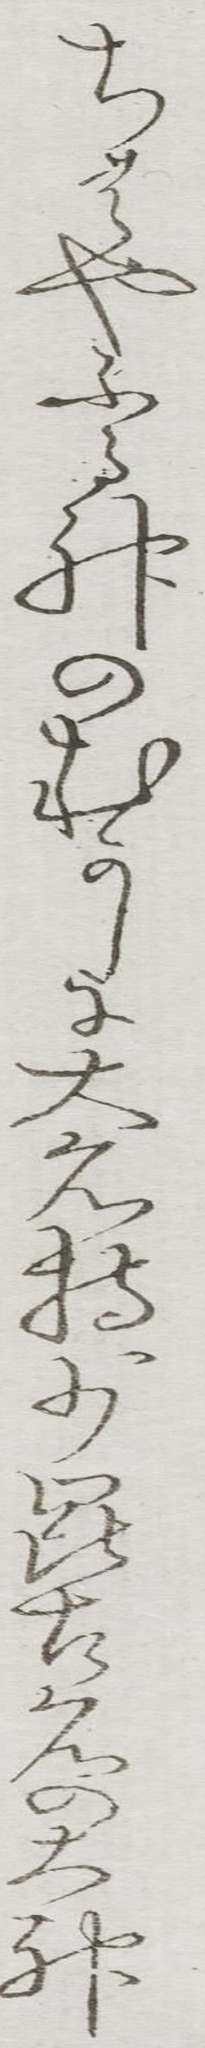ちはやふる神のむかしに大名持少毘古名の大神
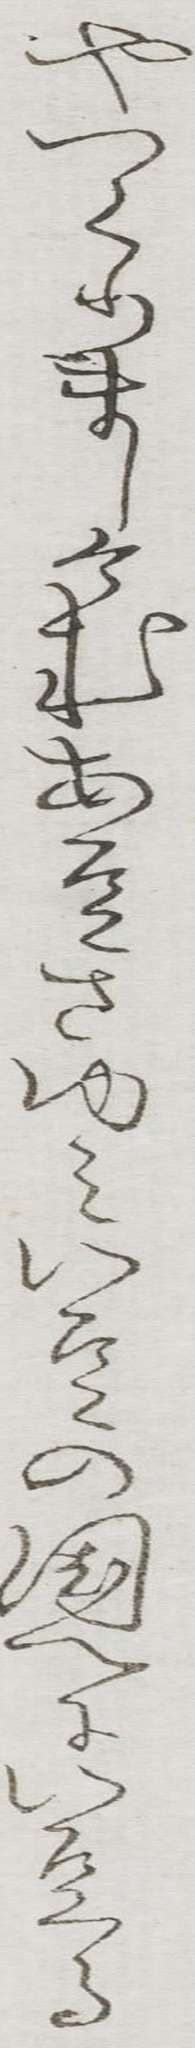やつくりましけむあつさゆみい豆の国へにいつる

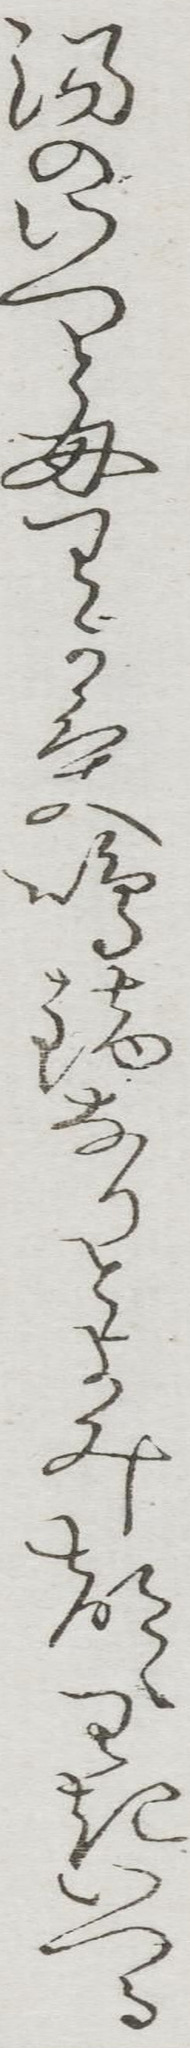湯のいつともわかす鳴鏑？なりとよみつゝわきいつる
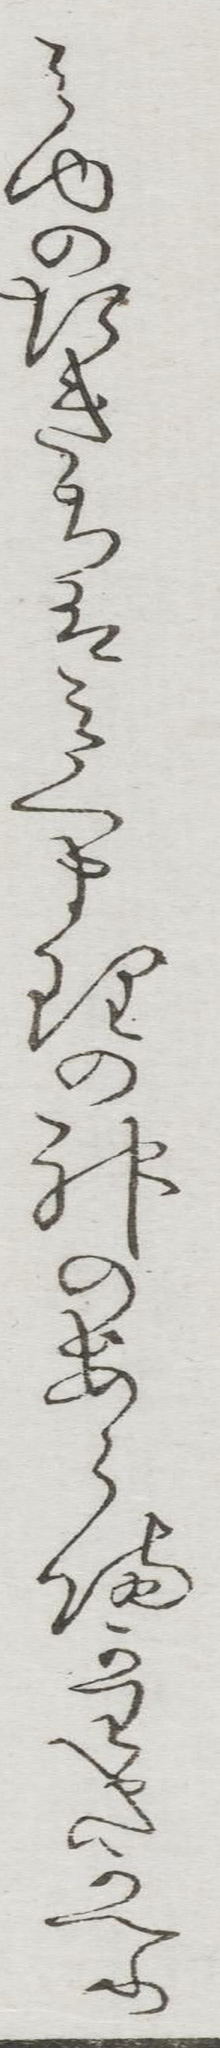みゆのたきちはみくまりの神のあらひかわきかへり
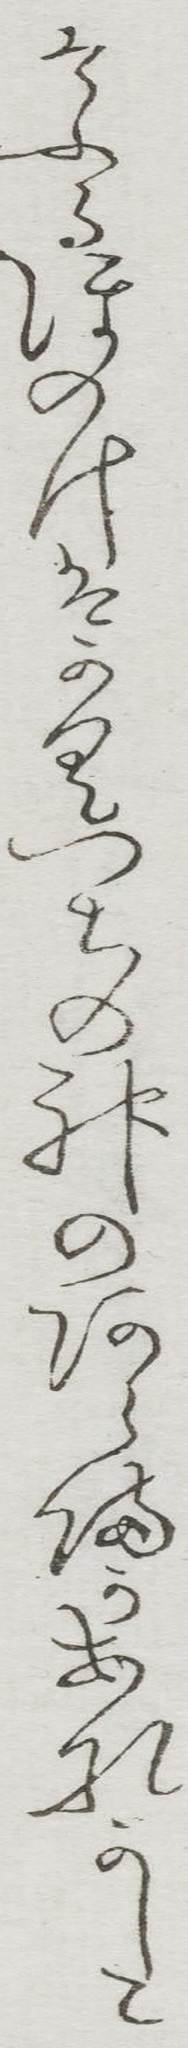けふるほのけはかくつちの神のあらひかあなかしこ
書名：挿画熱海日記　全
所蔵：東京大学地震研究所図書室 Earthquake Research Institute Library, The University of Tokyo, JAPAN
